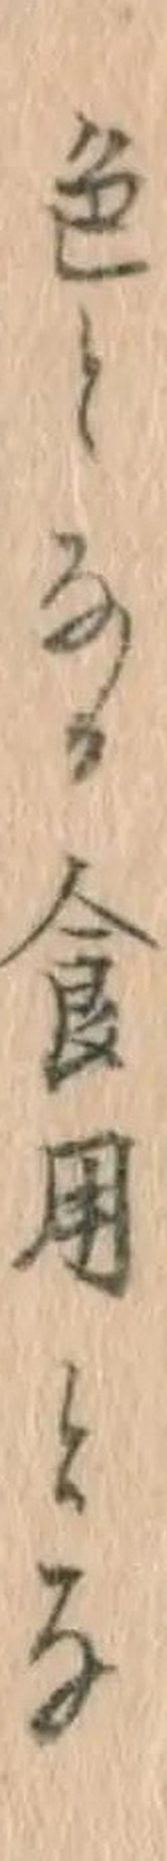色となる食用とな
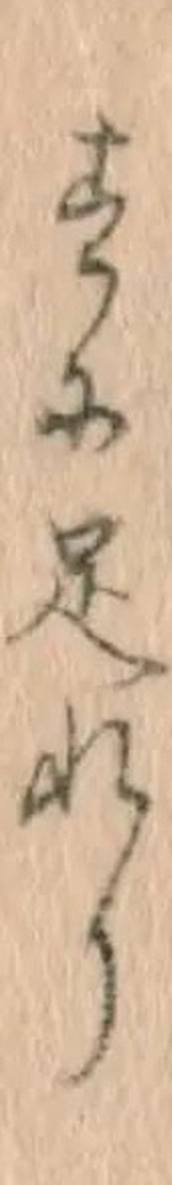すに足れり
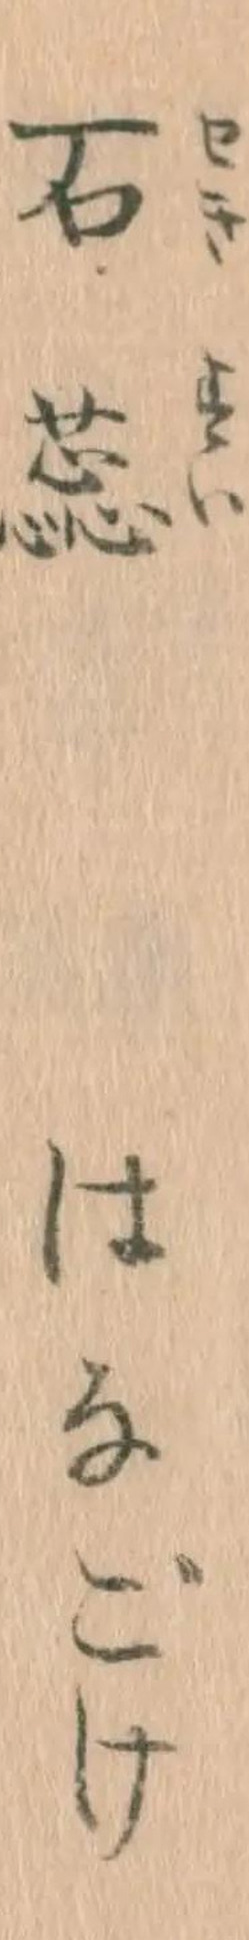石蕊はなごけ
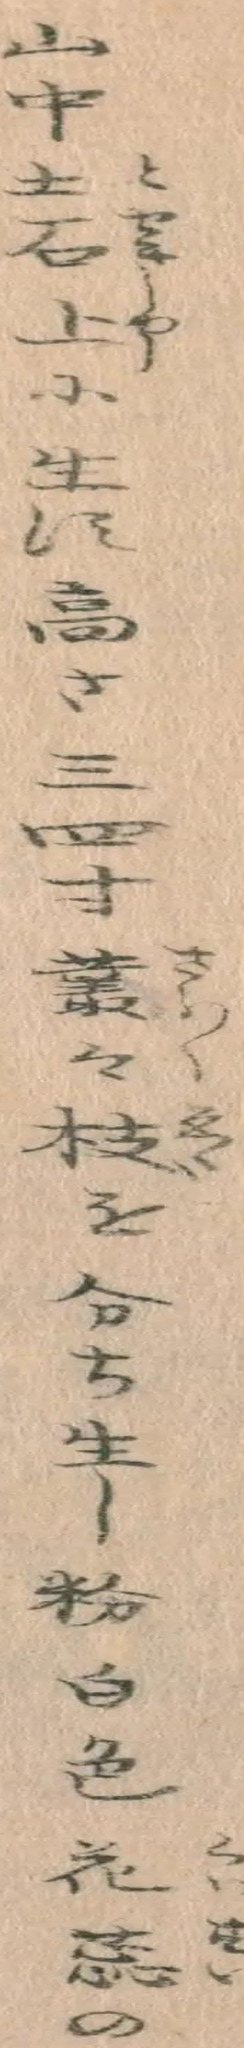山中土石上に生す高さ三四寸叢々枝を分ち生し粉白色花蕊の
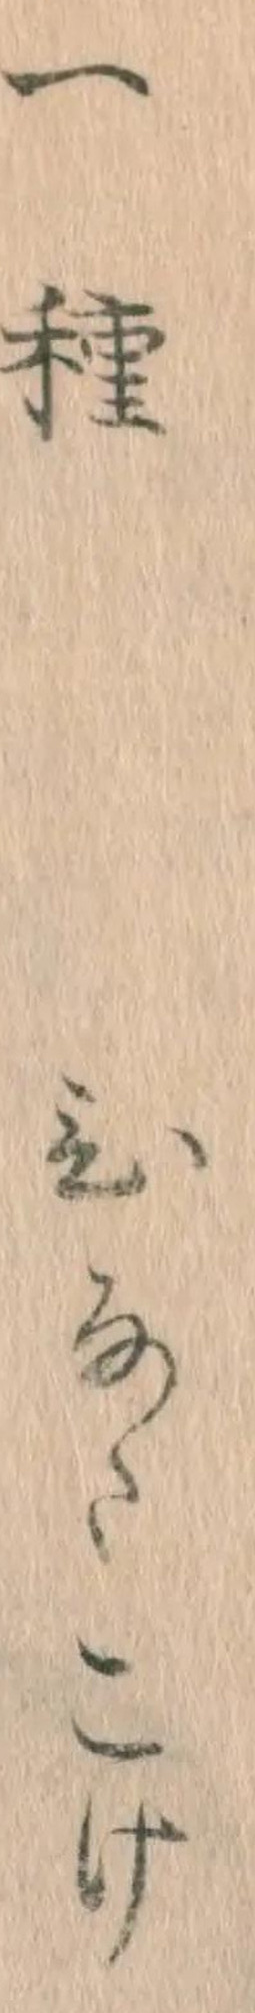一種ひなたこけ
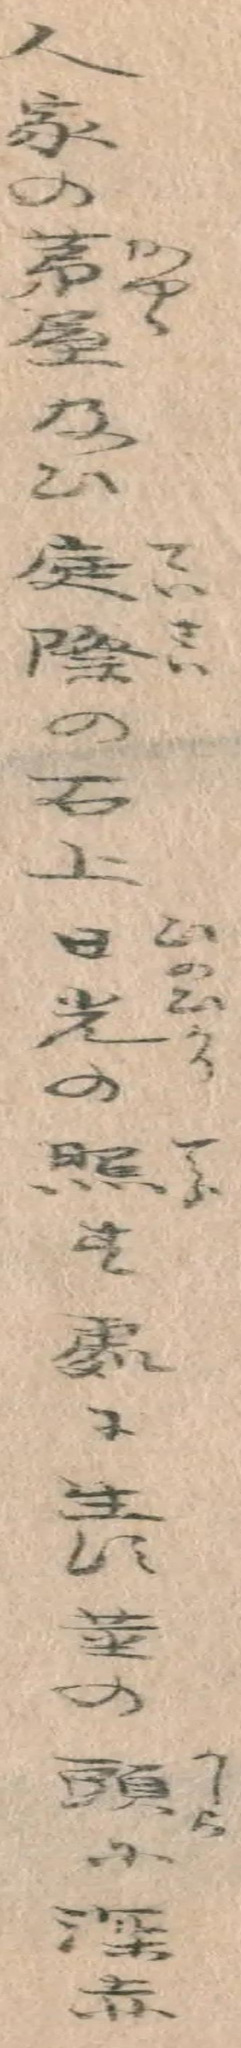人家の茅屋及ひ庭際の石上日光の照す処に生す茎の頭に深赤
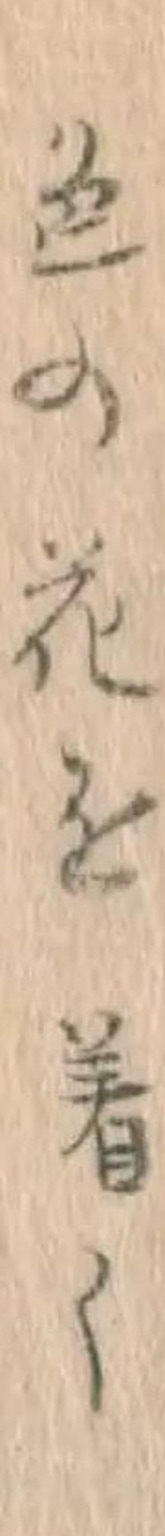色の花を着く

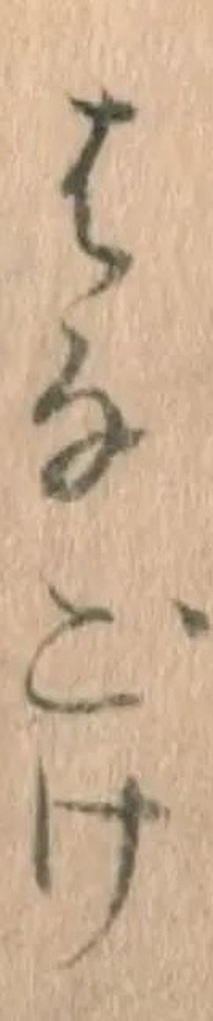はなごけ
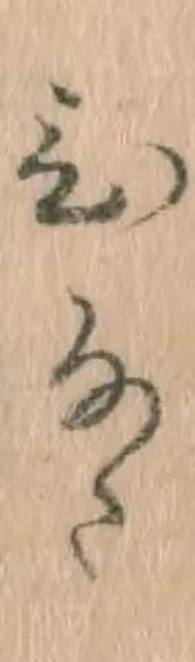ひなた
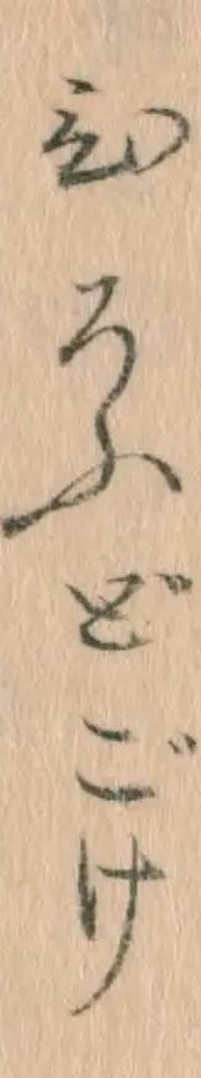ひろふどごけ
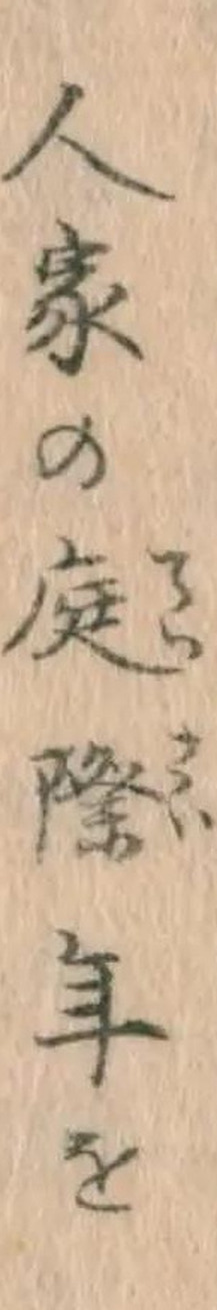人家の庭際年を
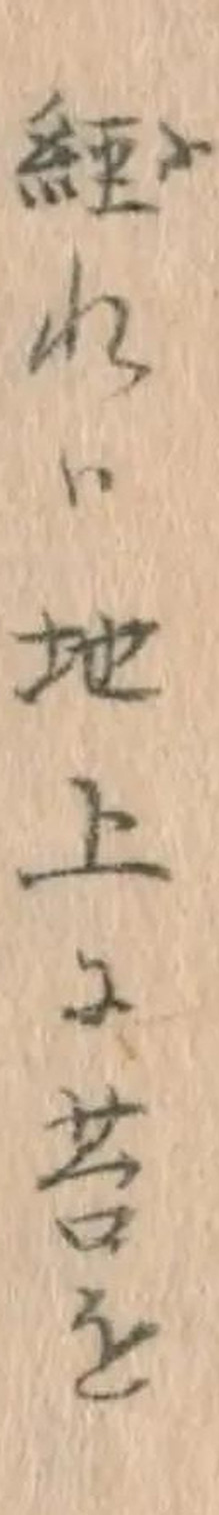経れは地上に苔を
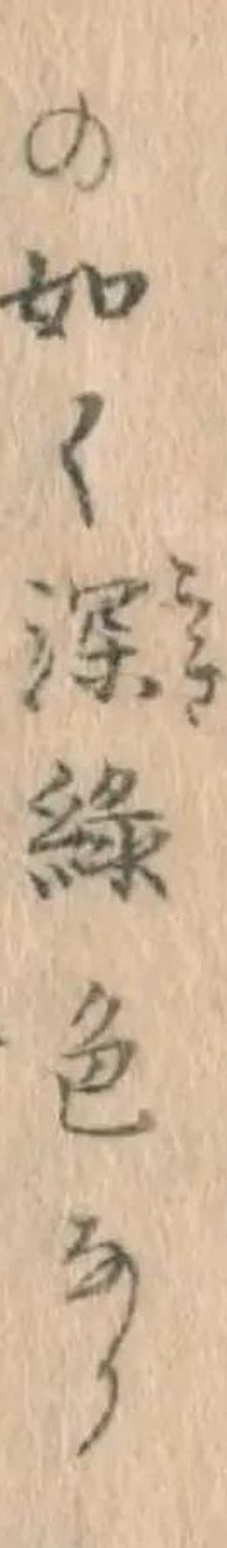の如く深緑色なり
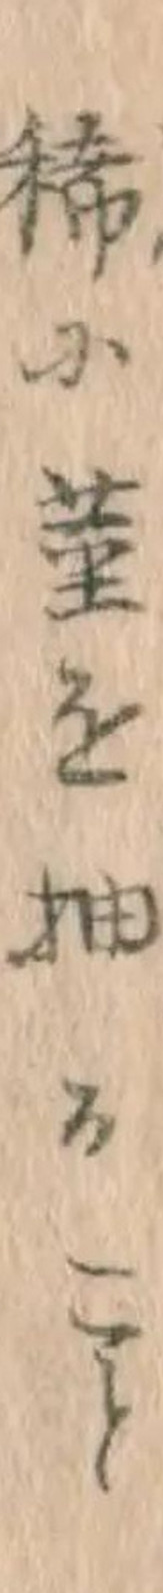稀に茎を抽ること
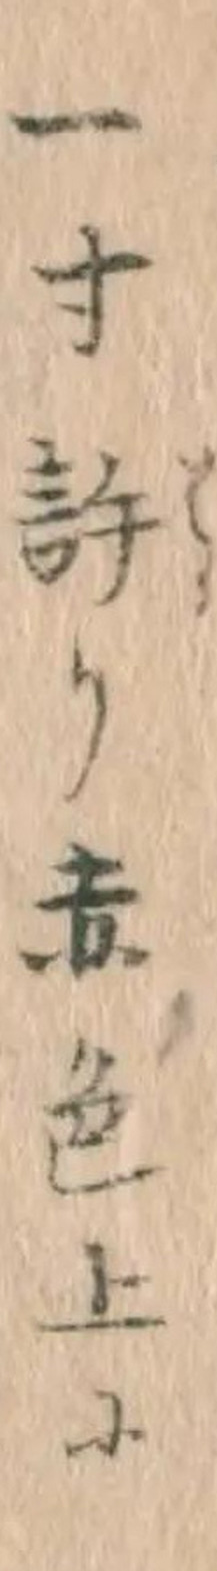一寸許り赤色上に
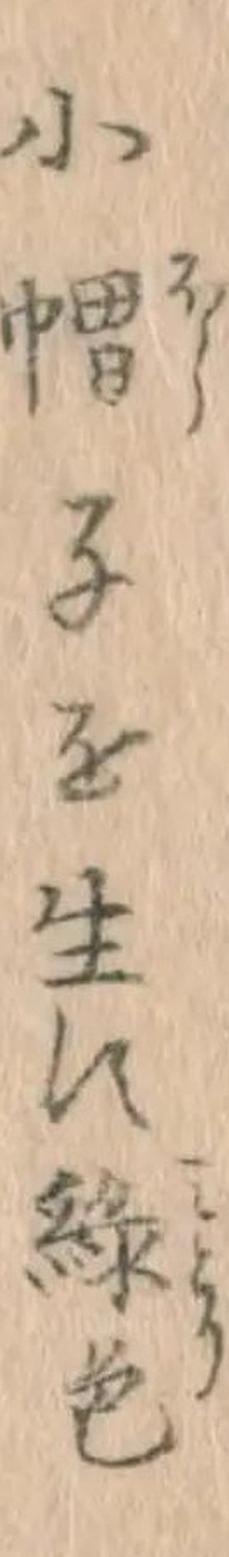小帽子を生す緑色
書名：本草図譜. 巻37-39
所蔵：国立国会図書館 National Diet Library, JAPAN
